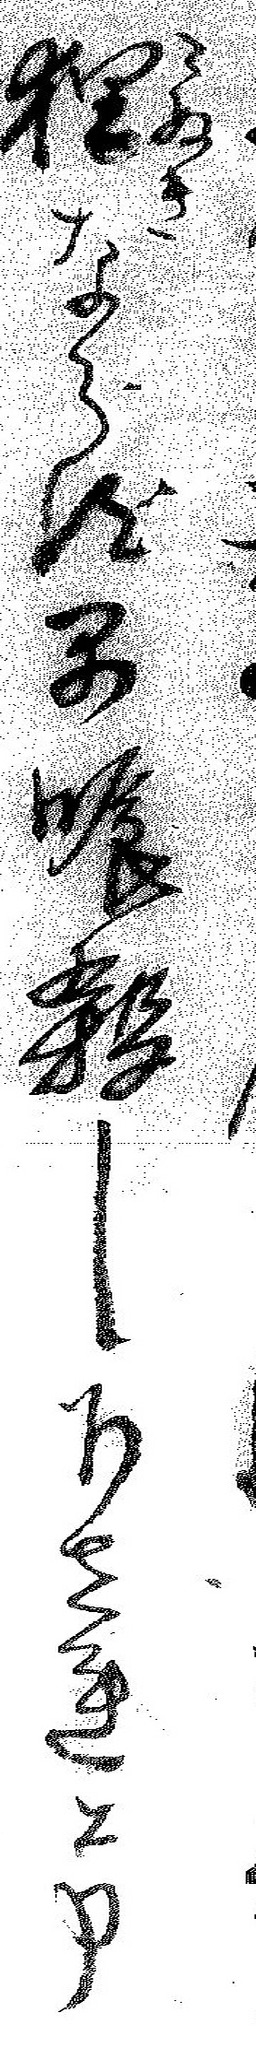狸ならず早喰殺し下されと申
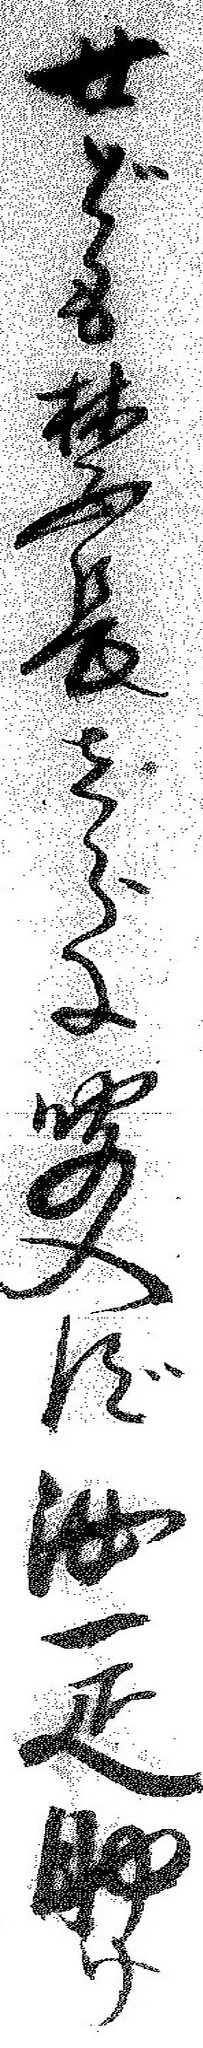せども禁長さらに聞入ず汝一疋助け
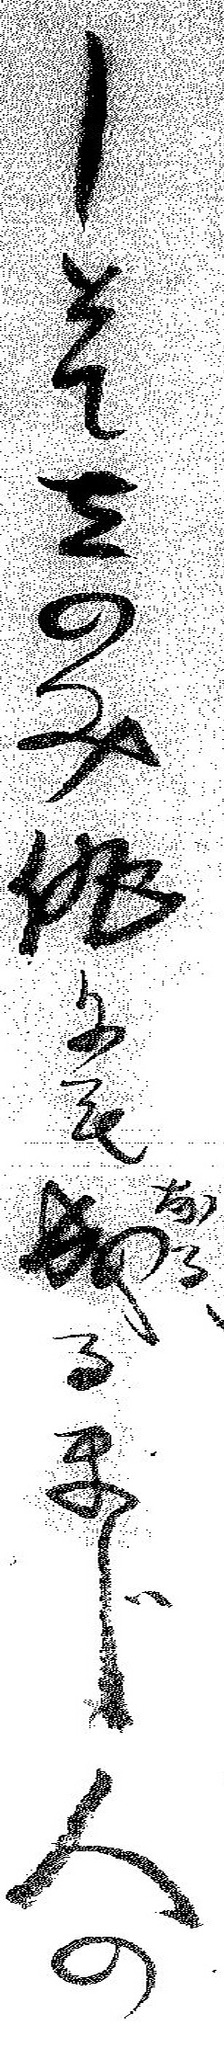しとてさのみ仇にも成るまじ人の
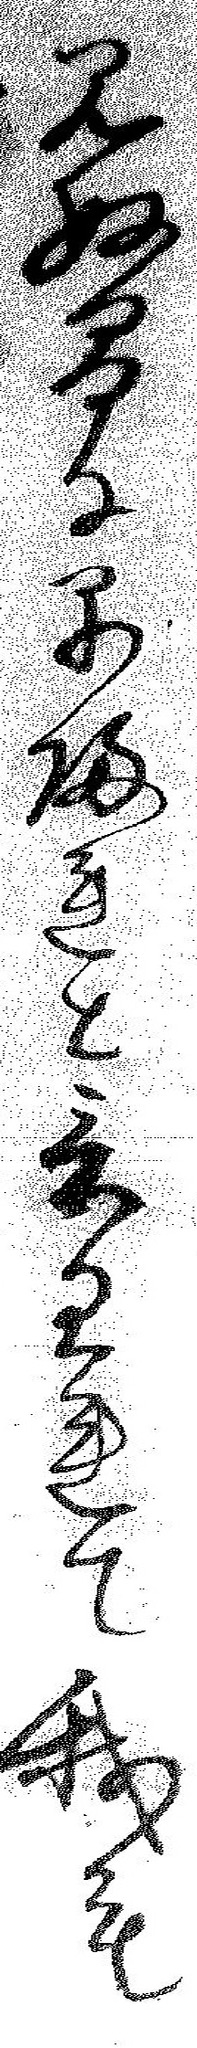見ぬ間に早帰れと云われて我も
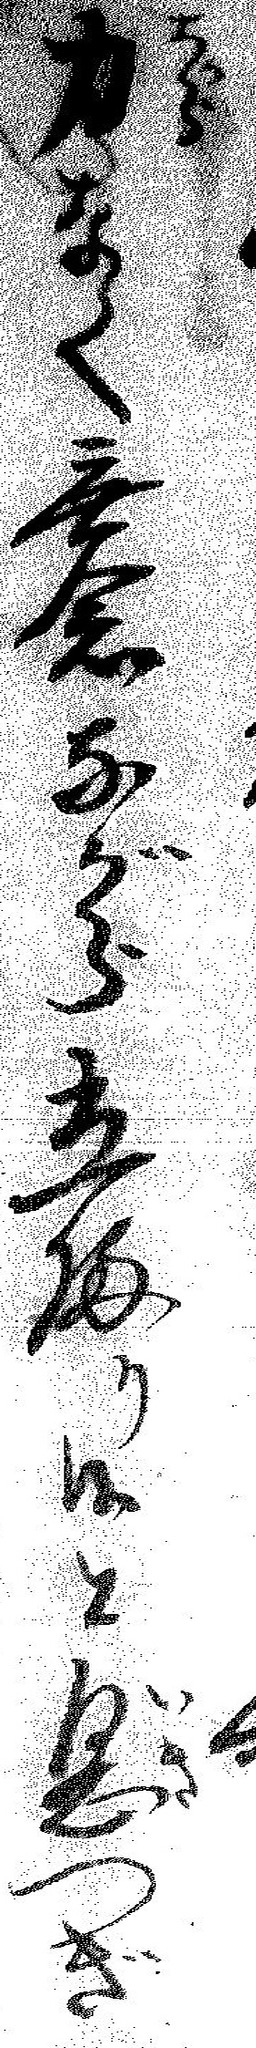力なく無念ながら立帰り候と息つぎ
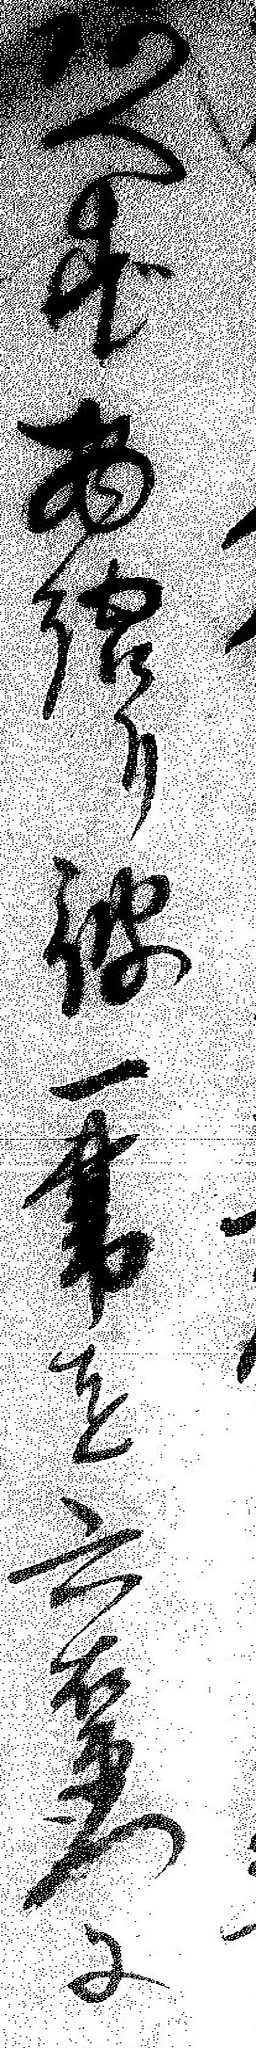あへず物語り彼一書を六右衛門に

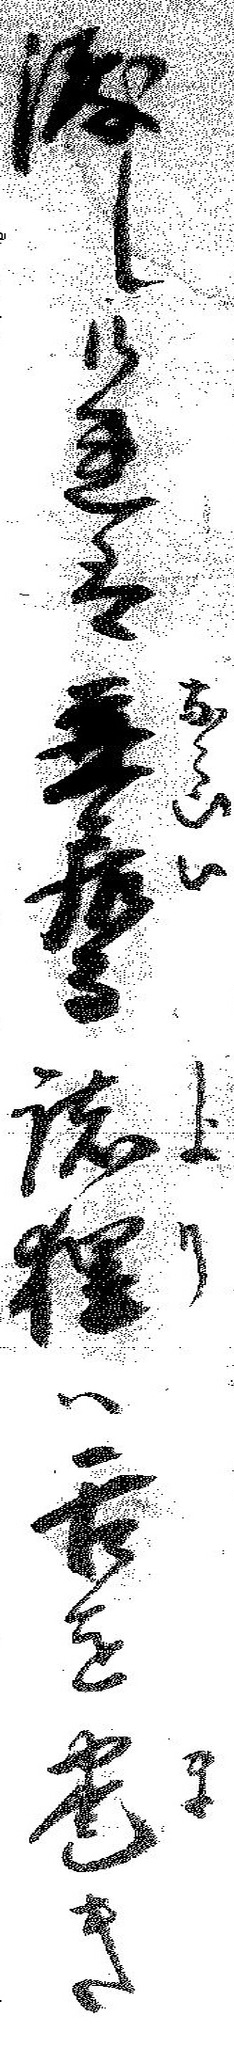渡しけれは並居る諸狸は舌を巻き
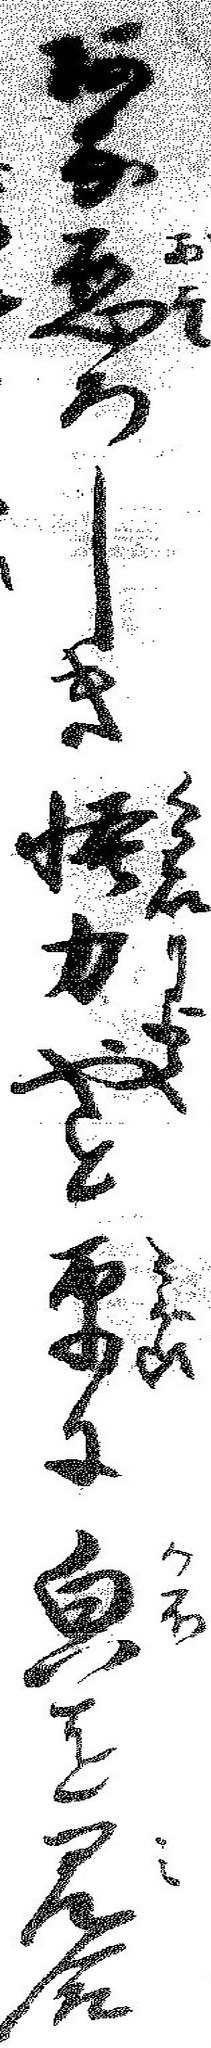あな恐ろしき怪力やと互に皃を見合
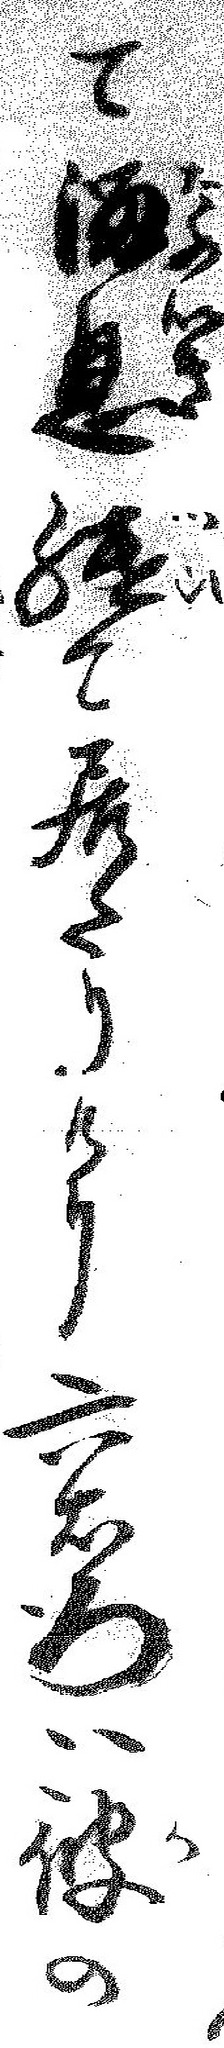て溜息継て居たりけり六右衛門は彼の
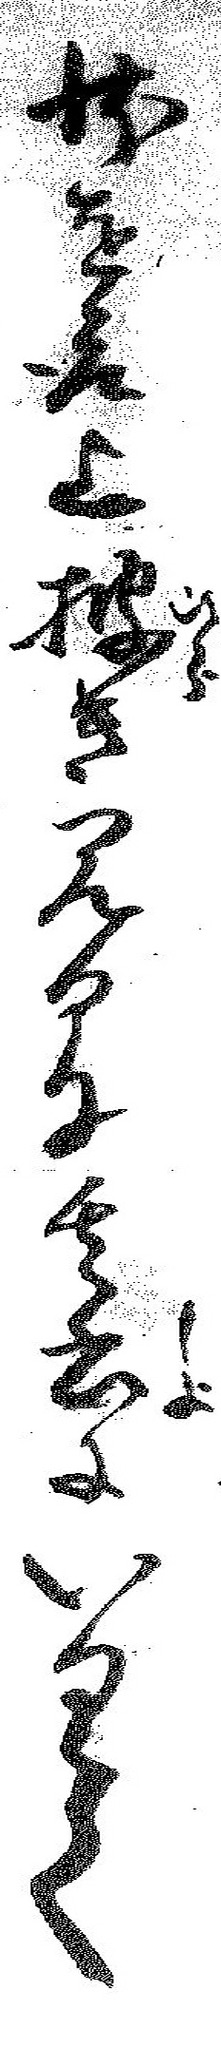状を取上披き見るに其書にいわく
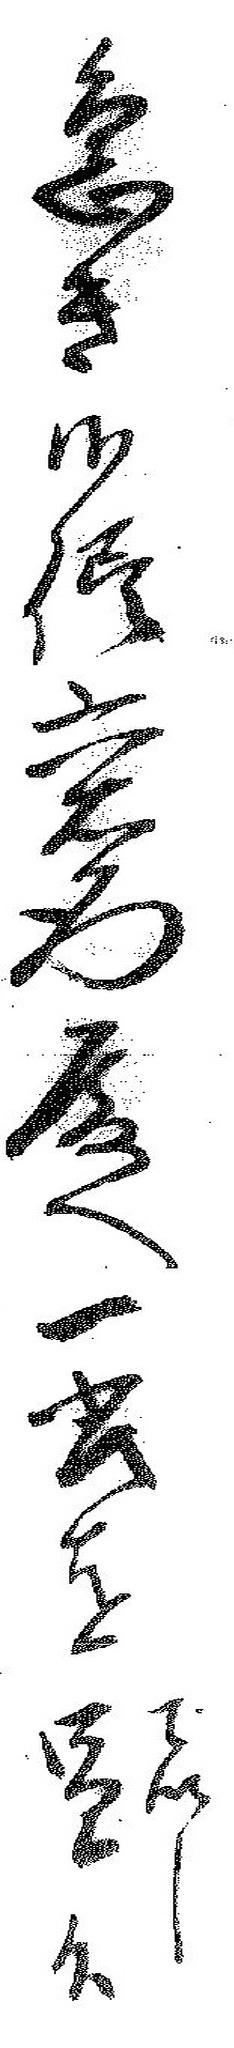急き候侭六右衛門殿へ一書を呈候
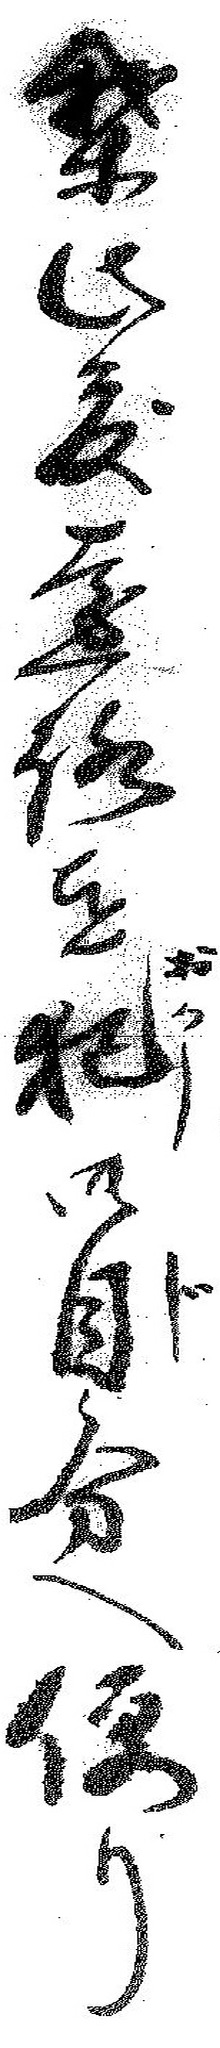我等此度遠路を犯御自分へ便り
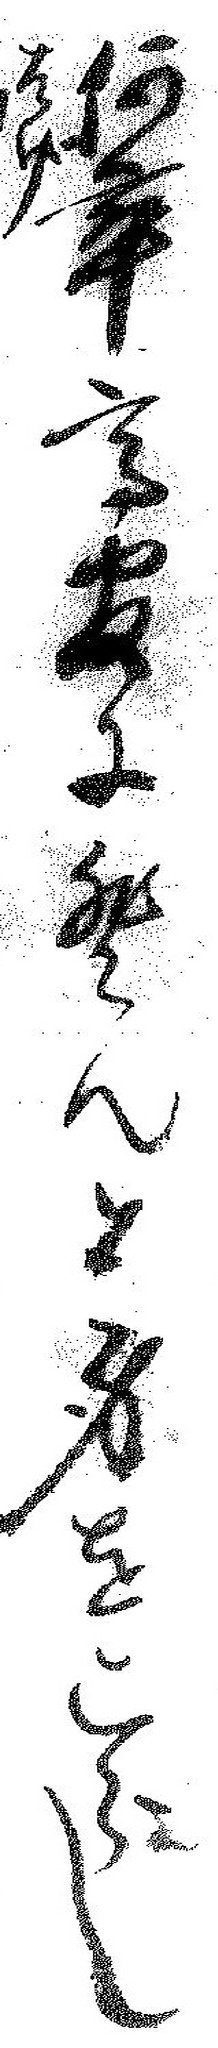何卒高官に登んと身をこらし
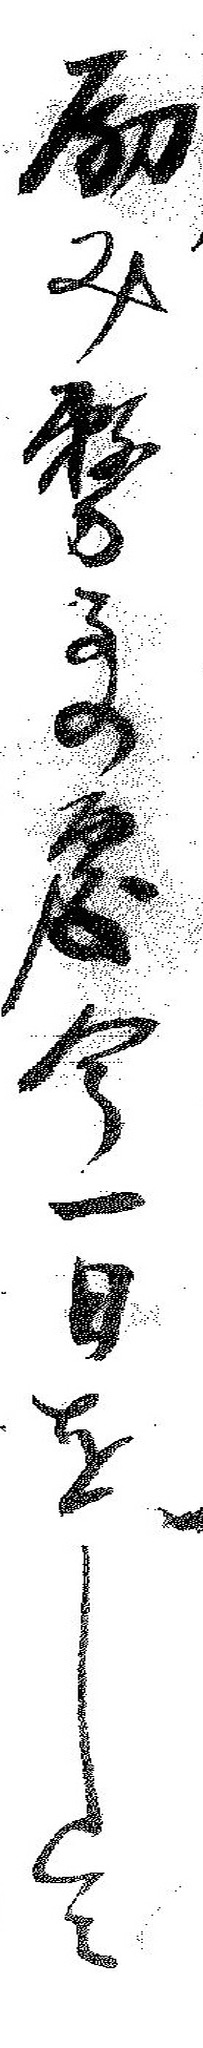励み務るの処今一日をして
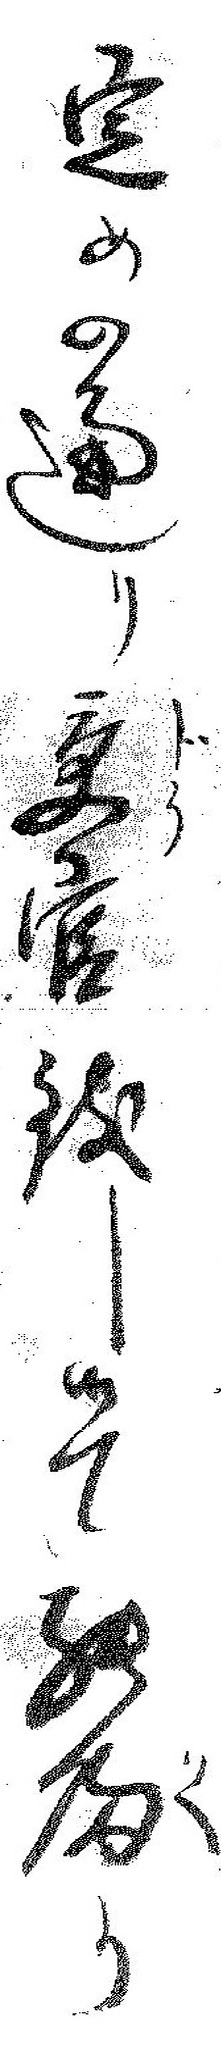定めの通り受官致し候て罷帰り
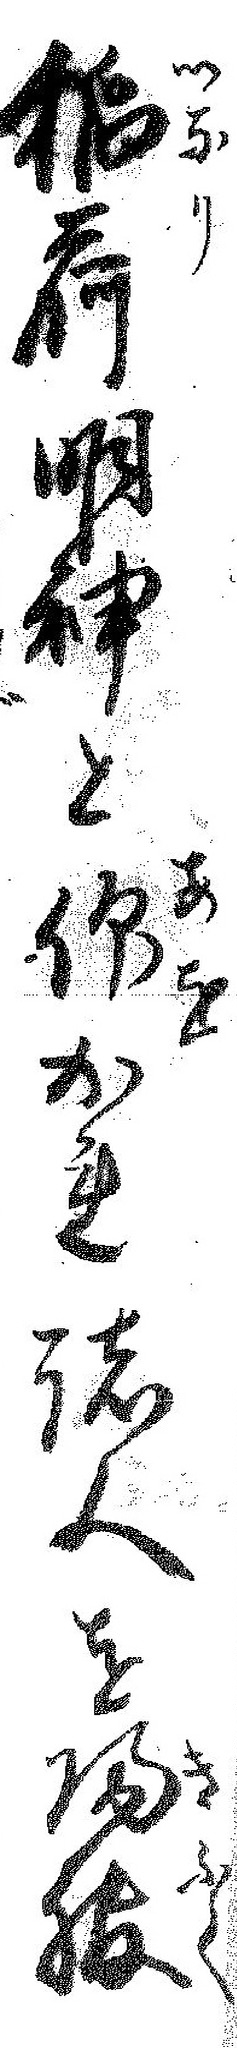稲荷明神と仰かれ諸人を帰服
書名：近頃古狸珍説　礼義智信
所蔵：徳島県立図書館
